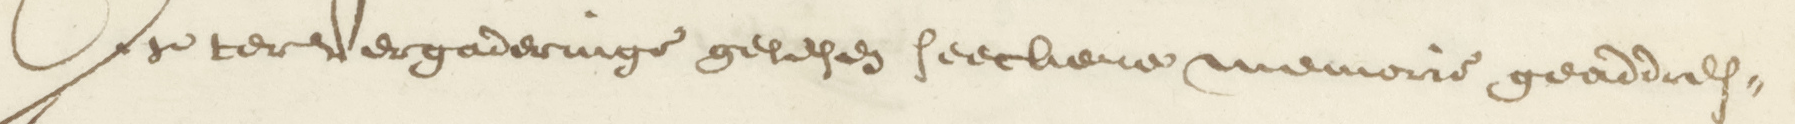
Is ter Vergaderinge gelesen seeckere memorie geaddres„
